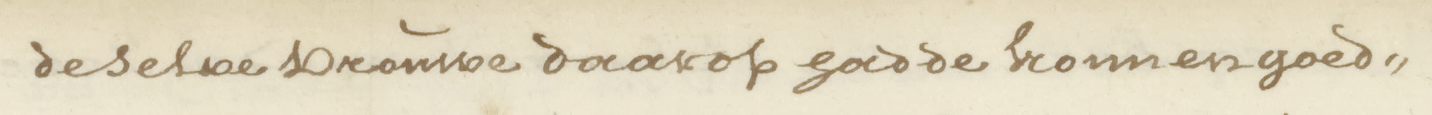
deselve Vrouwe daarop hadde konnen goed„
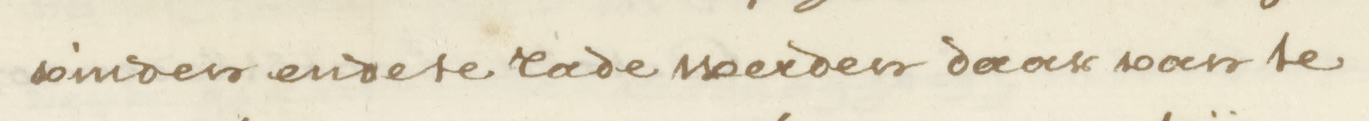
vinden ende te rade werden daar van te
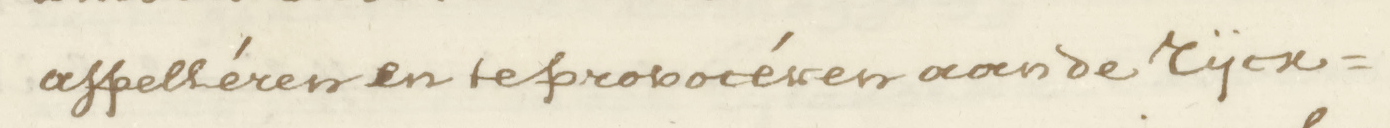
appelleren en te provoceren aan de Rijcx„
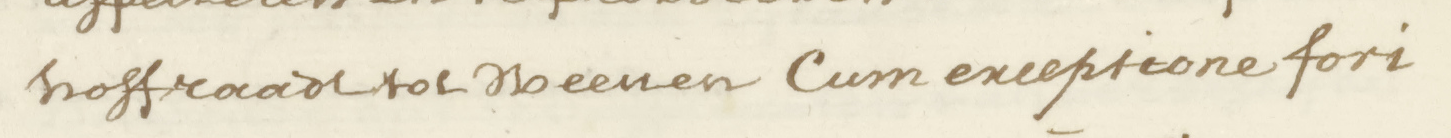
hoffraadt tot Weenen Cum exceptione fori
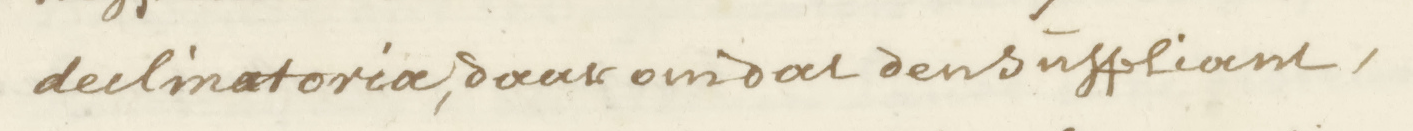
declinatoria, daar omdat den suppliant,
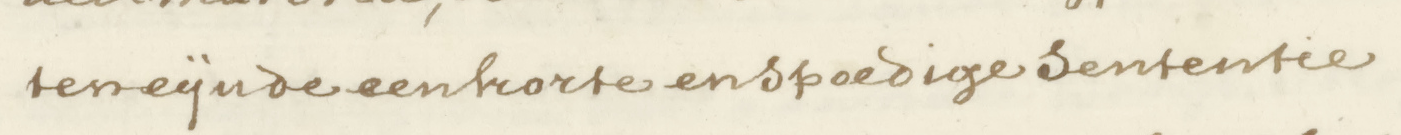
teneijnde een korte en spoedige sententie
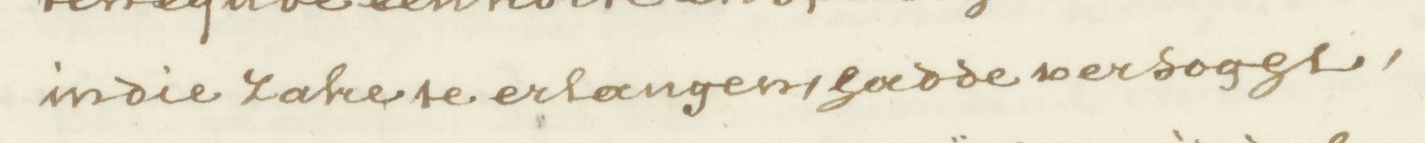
indie zake te erlangen, hadde versoght,
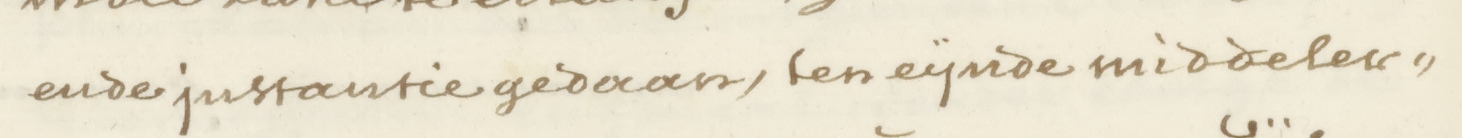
ende instantie gedaan, ten eijnde middeler„
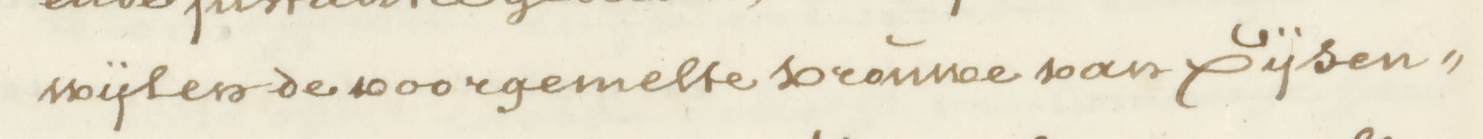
wijlen de voorgemelte Vrouwe van Gijsen„
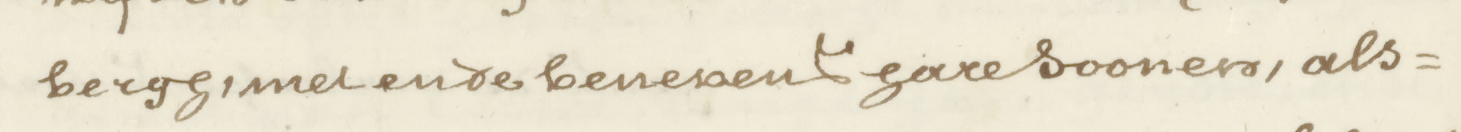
bergh, met ende benevens hare soonen, als„
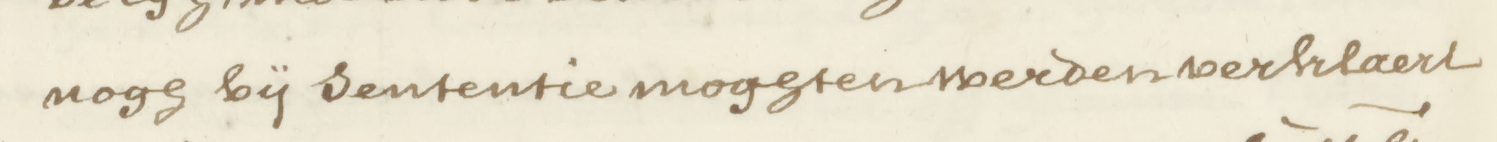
nogh bij sententie moghten werden verklaert
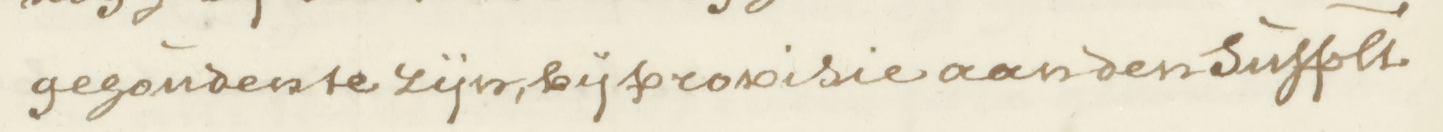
gehouden te zijn, bij provisie aan den Supplt
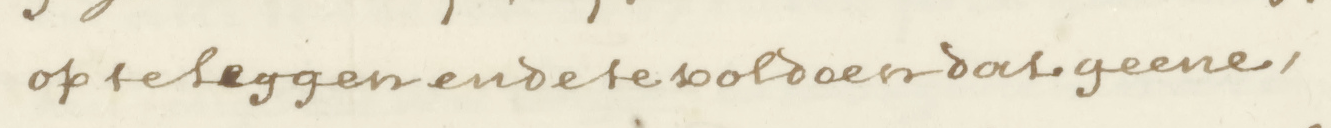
op te leggen ende te voldoen dat geene,
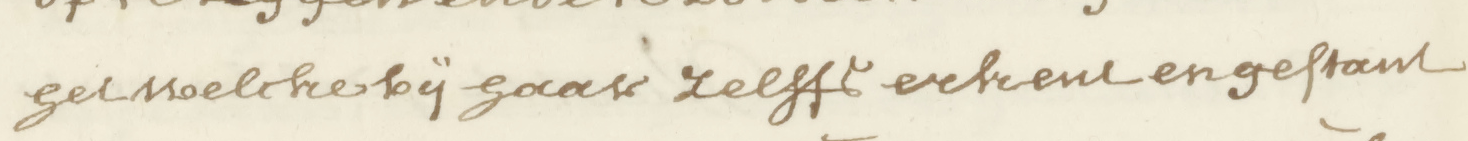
het welcke bij haar zelffs erkent en gestant
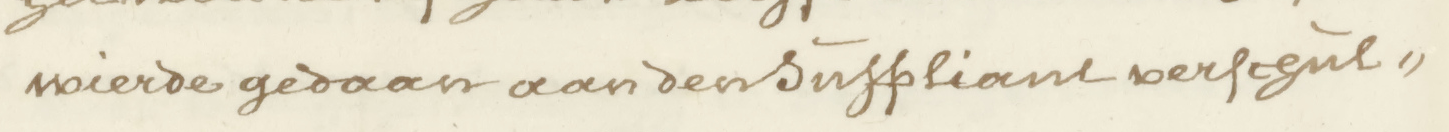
wierde gedaan aan den suppliant verschul„
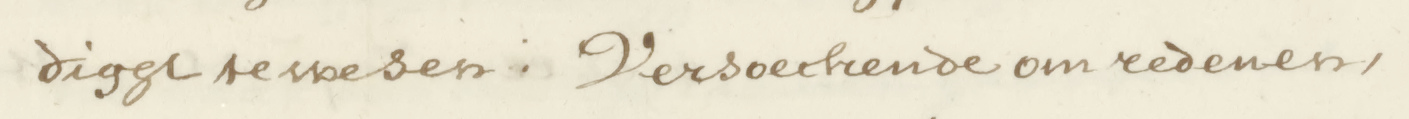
dight te wesen. Versoeckende om redenen,
